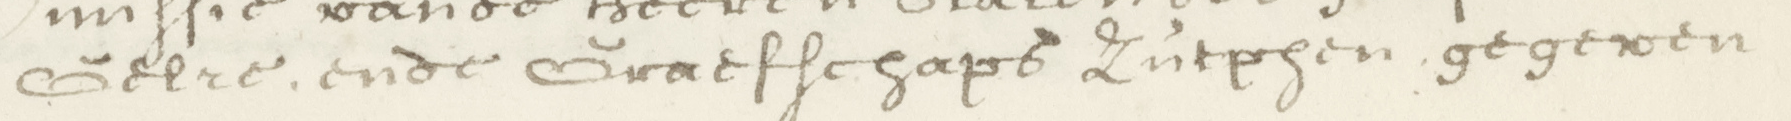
Gelre, ende Graefschaps Zutphen, gegeven
